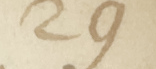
29
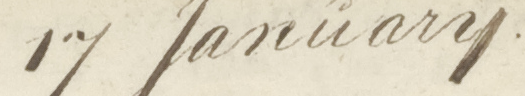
17 Januarij
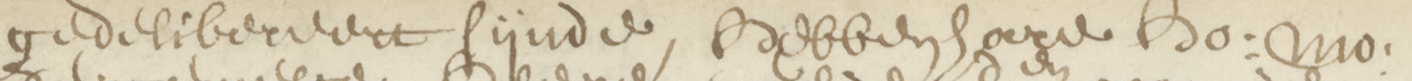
gedelibereert sijnde, hebben hare Ho:Mo:
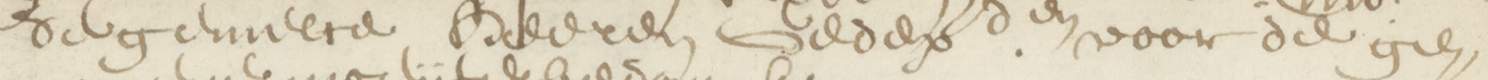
de gemelte Heeren Gedepden voor de ge,,
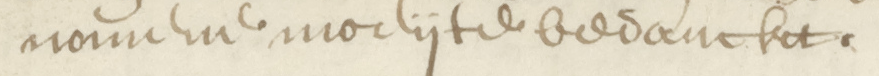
nomene moeijte bedanckt.
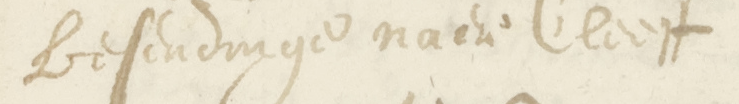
Besendinge naer Cleeff
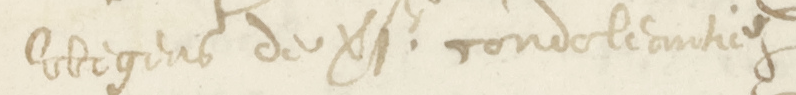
wegens de vs. condoleantie
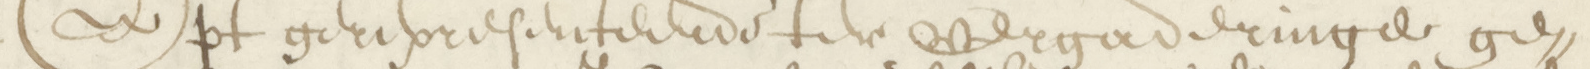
Opt gerepresenteerde ter Vergaderinge ge„
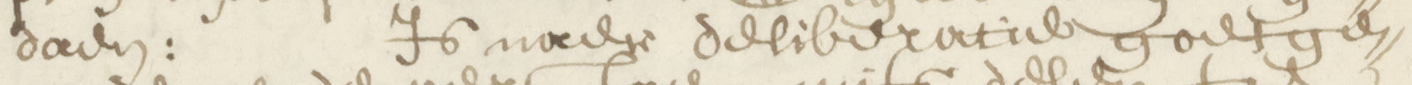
daen: Is naer deliberatie goetge,,
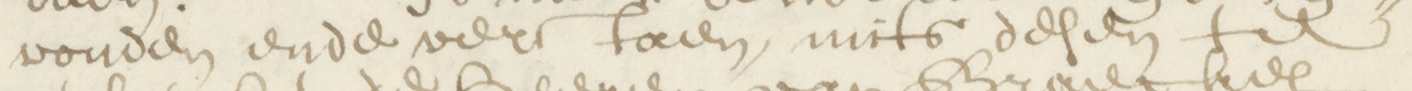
vonden ende verstaen, mits desen te
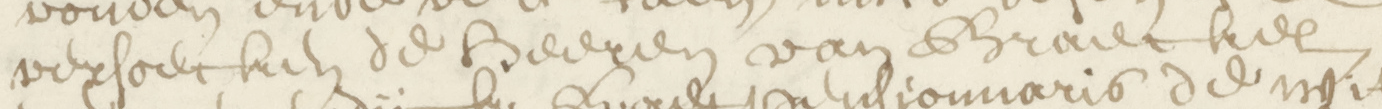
versoecken de Heeren van Braeckel,
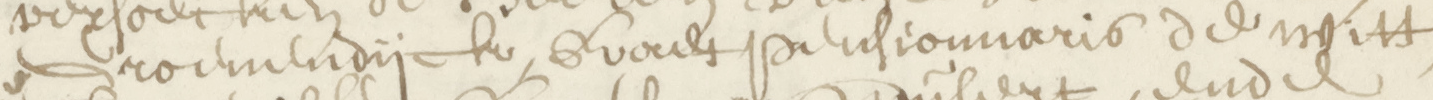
Groenendijck, Raetpensionnaris de Witt,
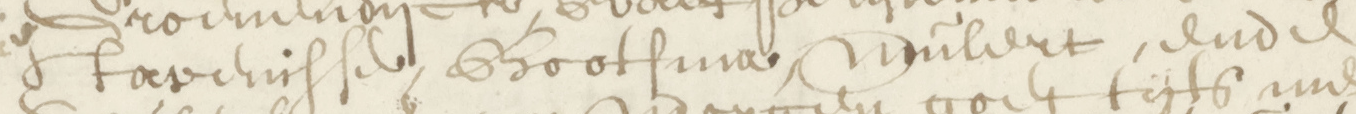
Stavenisse, Bootsma, Mulert, ende
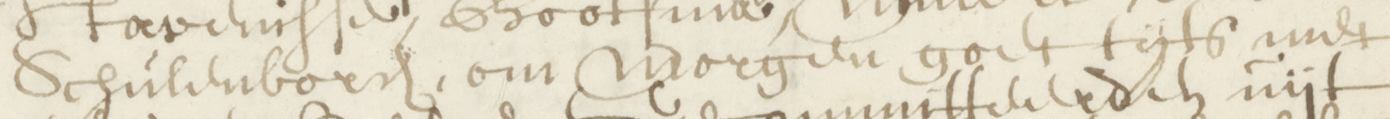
Schulenborch, om morgen goet tijts met
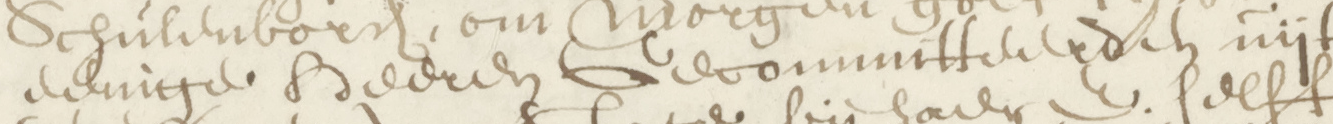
eenige Heeren Gecommitteerden uijt
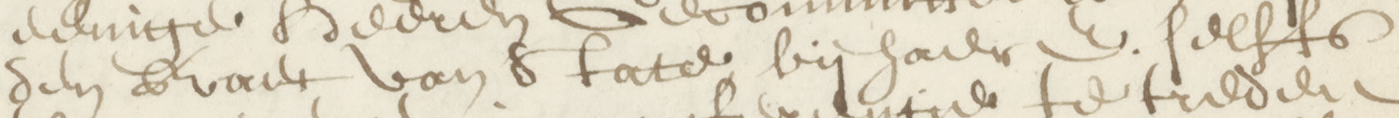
den Raet van State bij haer E. selffs
